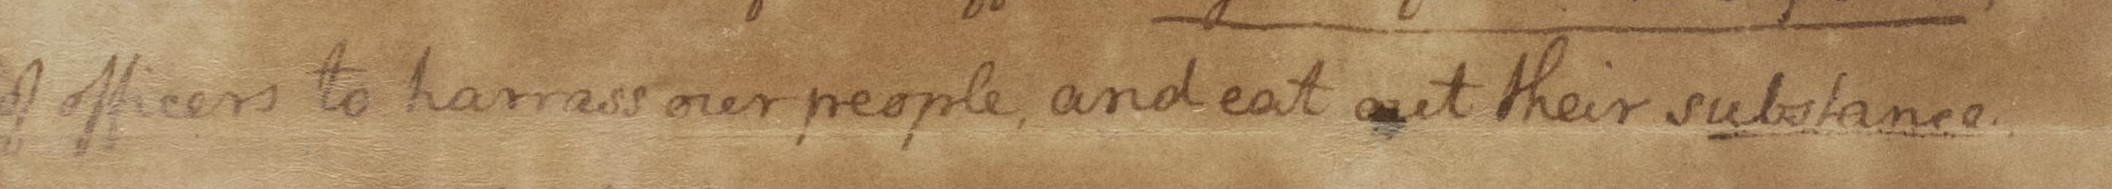officers to harrass our people and eat out their substance.
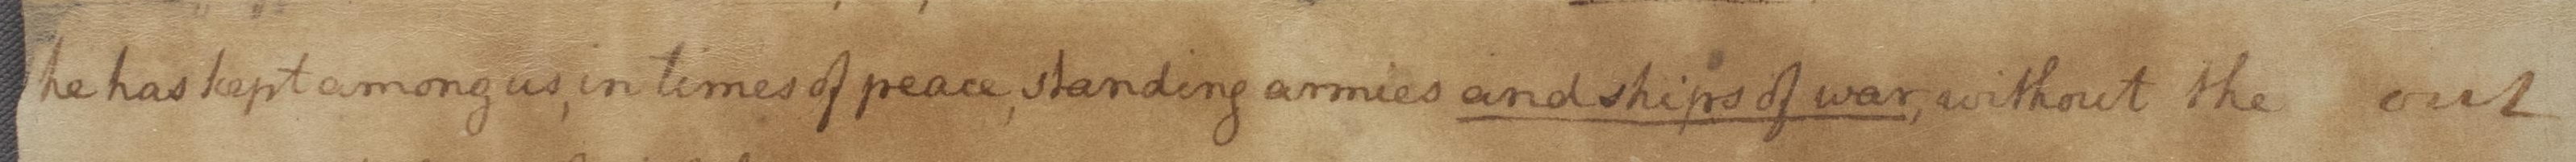he has kept among us, in times of peace standing armies and ships of war, without the out
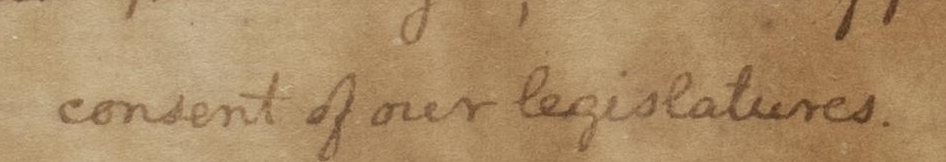consent of our legislatures.
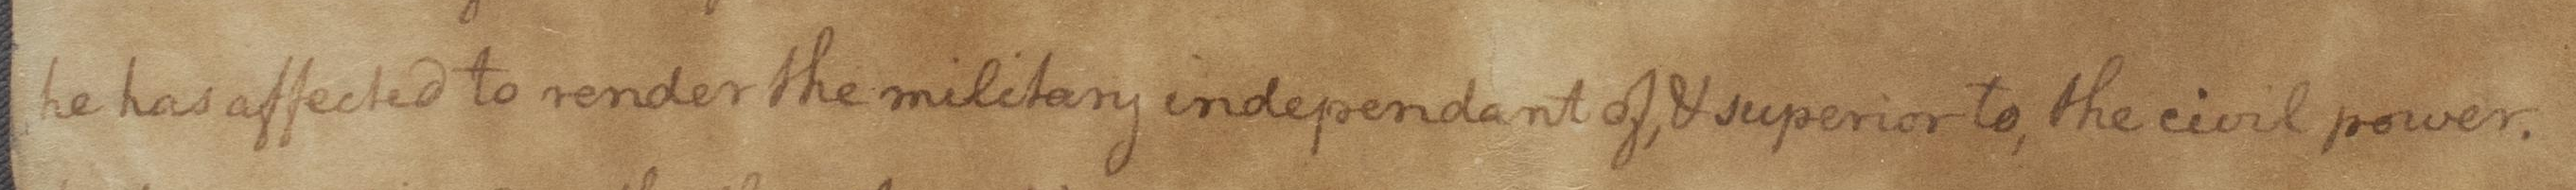he has affected to render the military independent of & superior to the civil power.
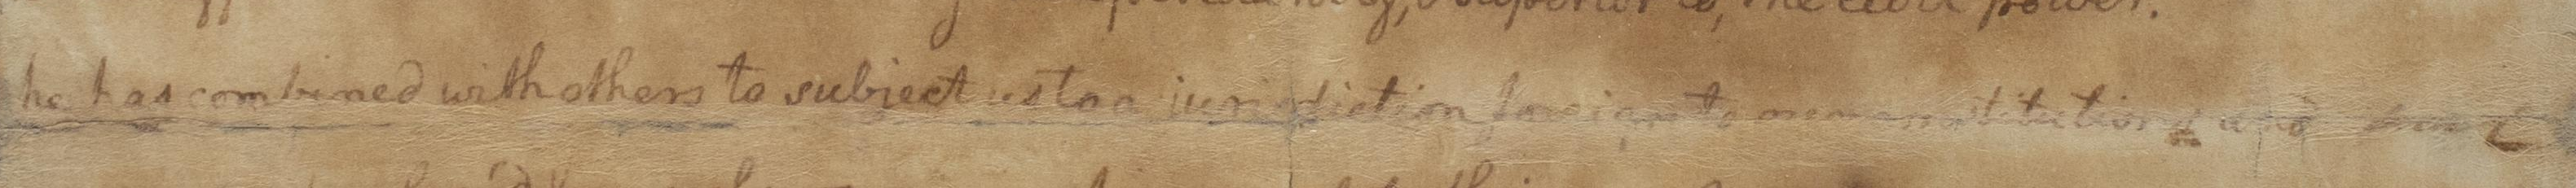he has combined with others to subject a jurisdiction foreign to our constitution and left
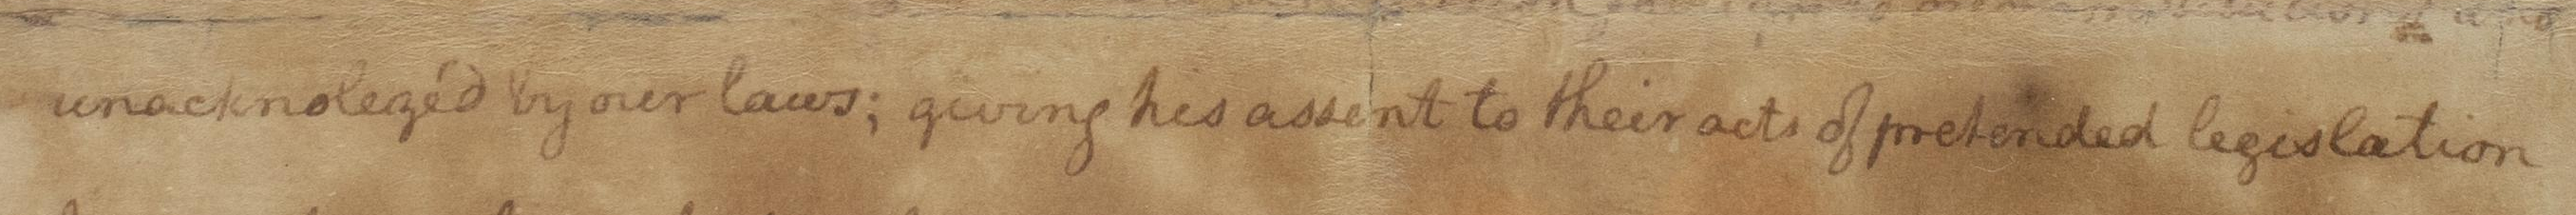unacknowledged by our laws; giving his assent to their acts of pretended legislation
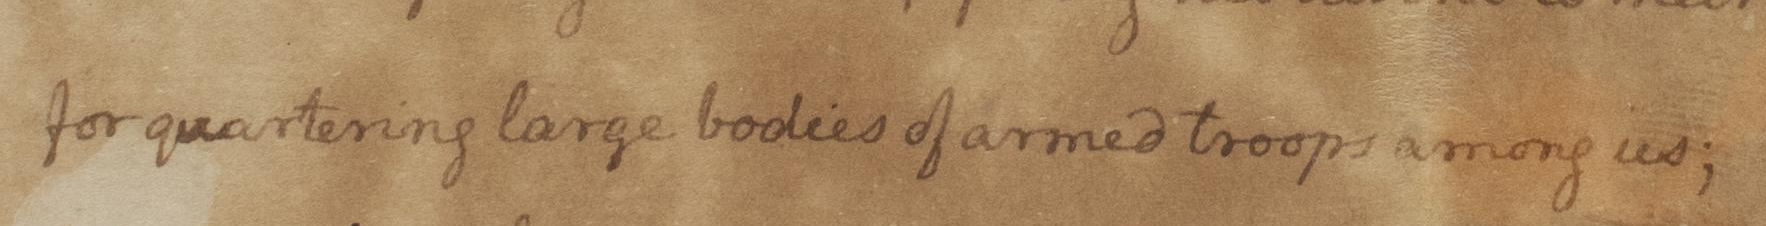for quartering large bodies of armed troops among us;
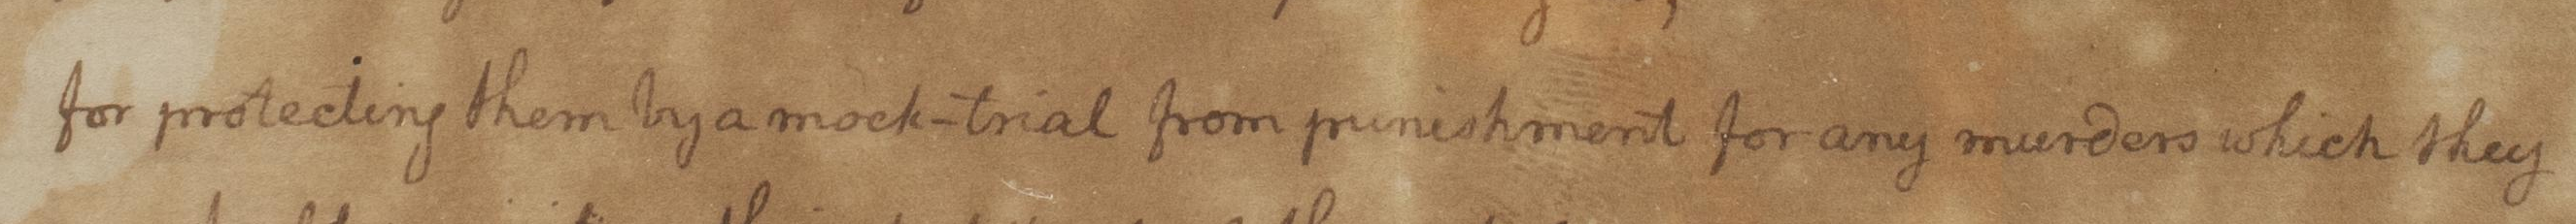for protecting them by a mock- trial from prunishment for any murders which they
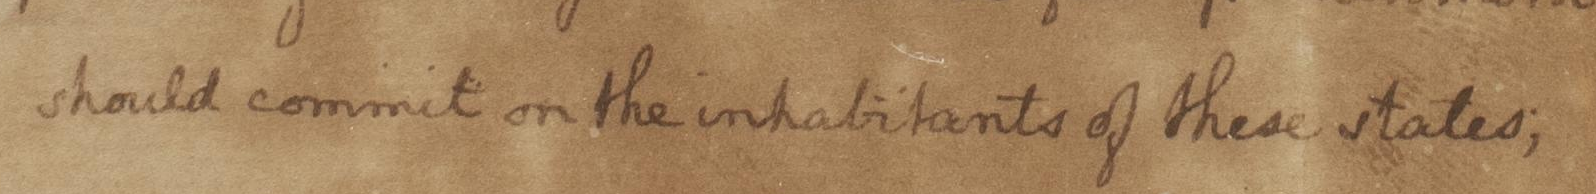should commit on the inhabitants of these states;
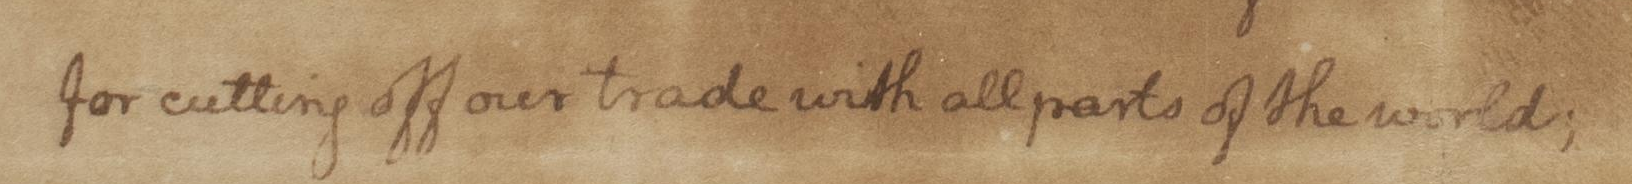for cutting off our trade with all parts of the world;
